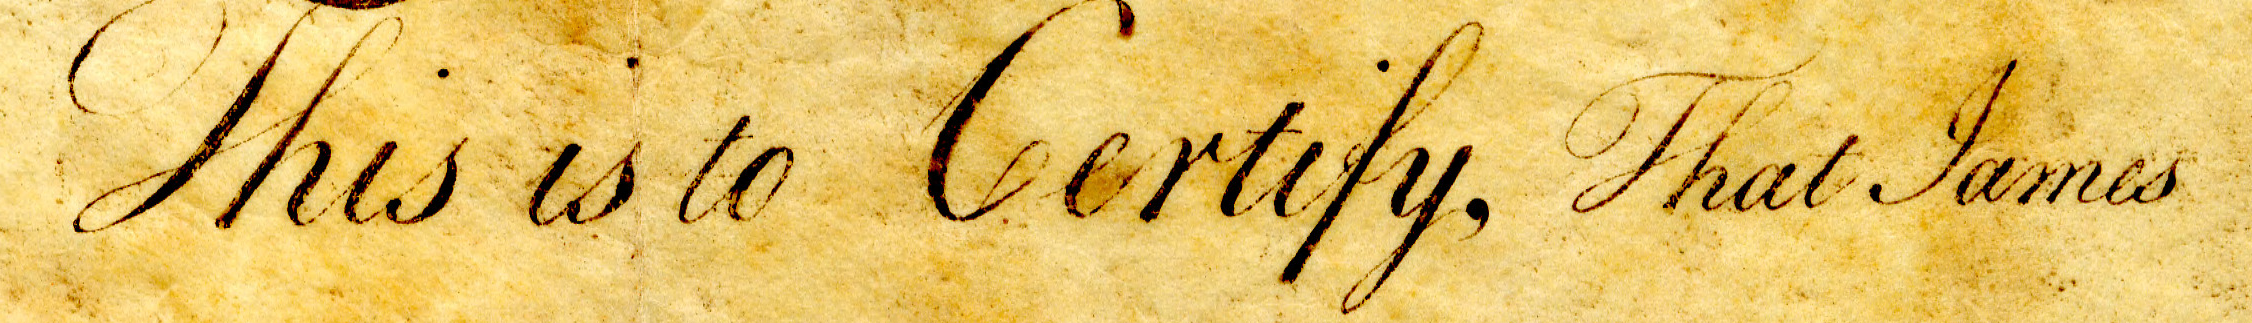This is to Certify, That James
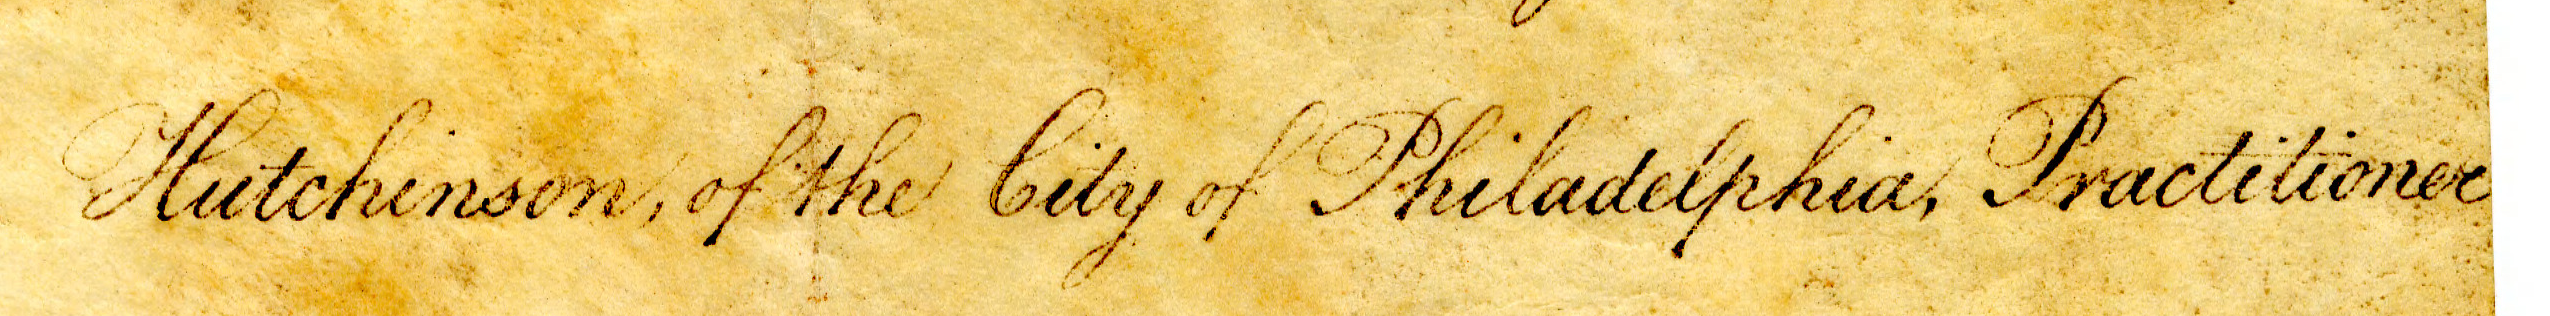Hutchinson of the City of Philadelphia, Practitioner
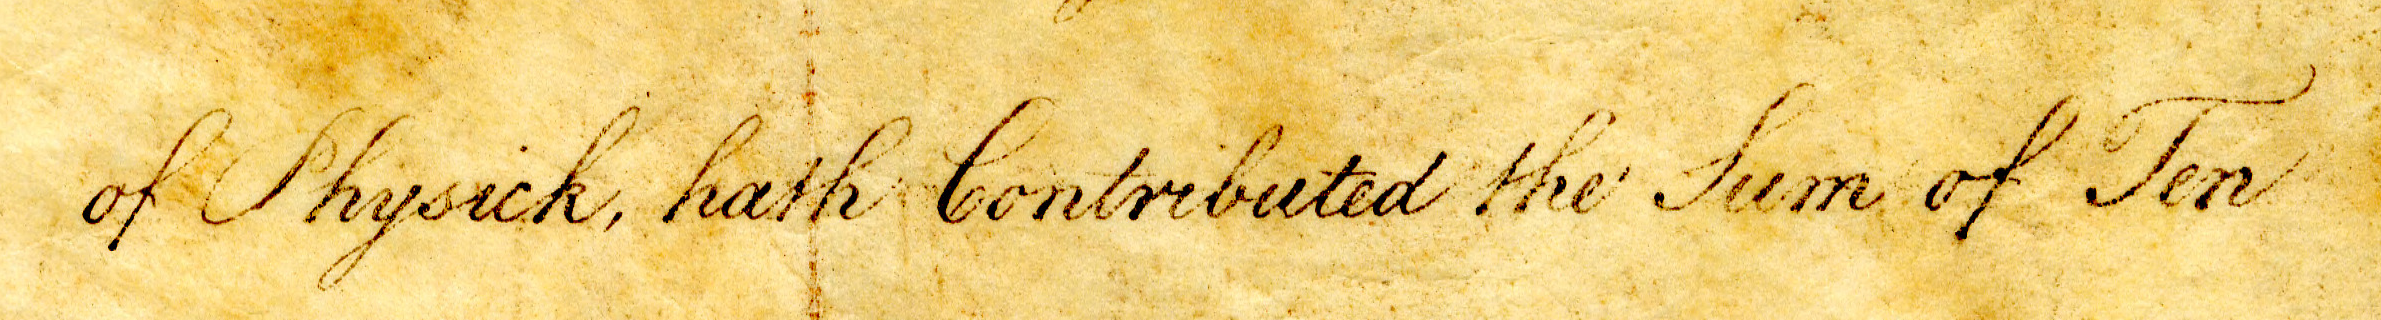of Physick, hath Contributed the Sum of Ten
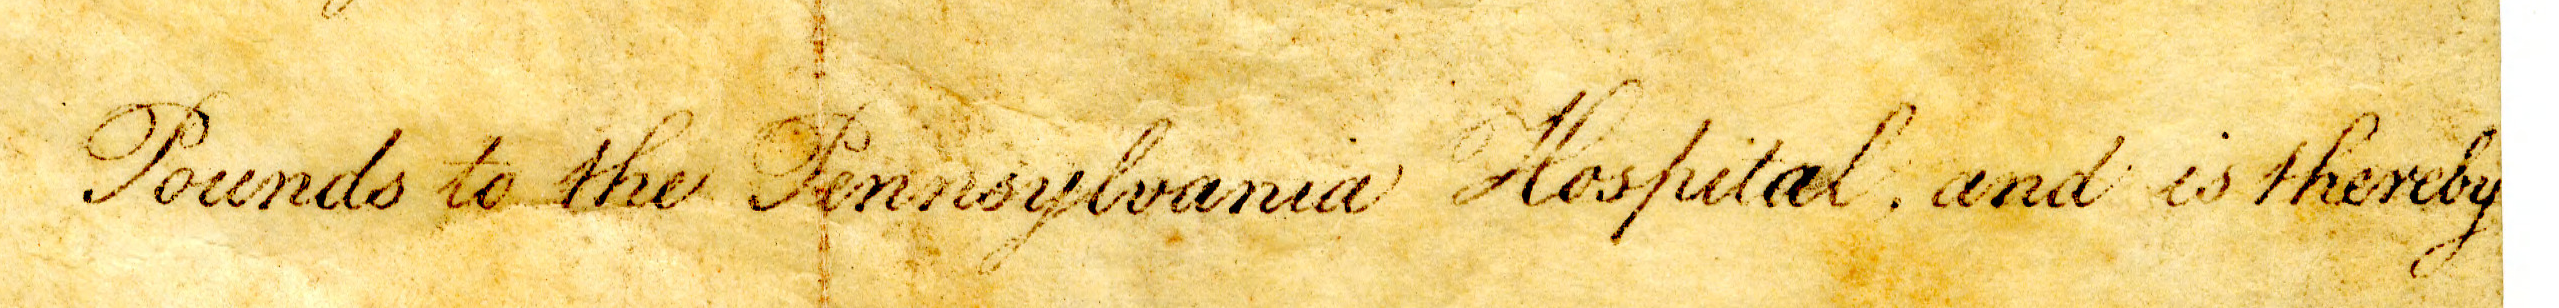Pounds to the Pennsylvania Hospital, and is thereby
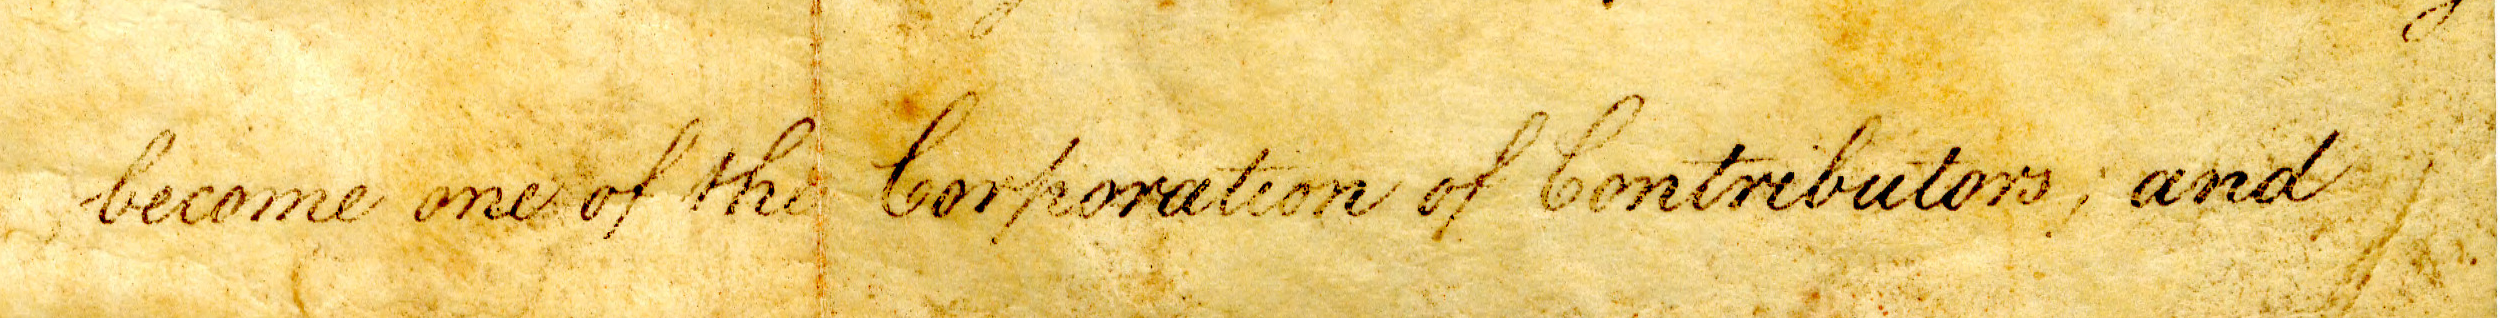become one of the Corporation of Contributors; and
